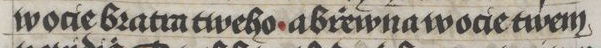w ocie bratra tweho.a bṙewna w ocie twem
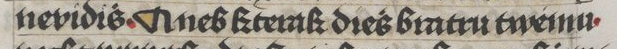nevidiš.A neb kterak dieš bratru twemu.
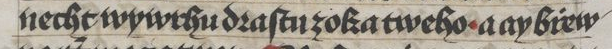necht wywrhu draſtu zoka tweho.a ay bṙew¬
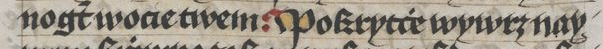no ḡt wocie twem?Pokrytċe wywrz nay¬
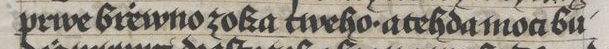prwe bṙewno zoka tweho.atehda moci bu¬
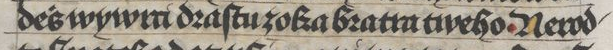deṡ wywrci dzaſtu zoka bratra tweho.Nerod¬
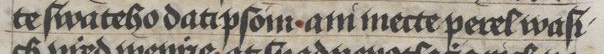te ſwateho dati pſóm.ani mecte perel waſi¬
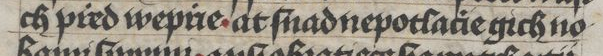ch pṙed wepṙie.at ſnad nepotlaċie gich no¬
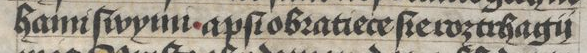hami ſwymi.apſi obratiece ſie roztrhagij
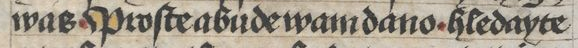was.Proſte a bude wam dano.hledayte
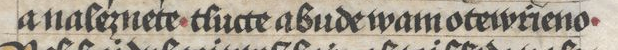a naleznete.tlucte a bude wam otewṙieno.
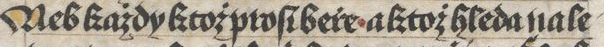Neb każdy ktoż proſi beṙe.aktoż hleda nale¬
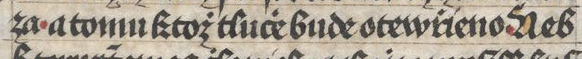za.a tomu ktoż tluċe bude otewṙíeno.Neb
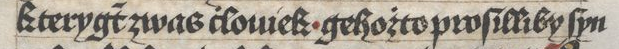ktery ḡt zwas ċlouíek.gehożto proſilli by ſyn
